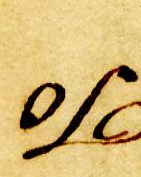To
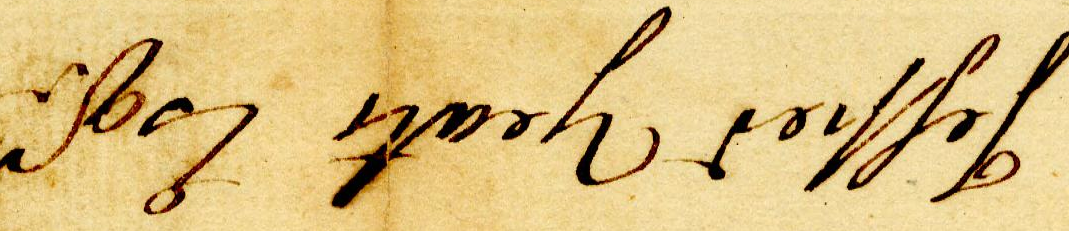Jesper Yeats Esq^r.
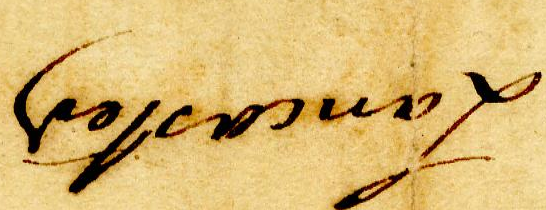Lancaster
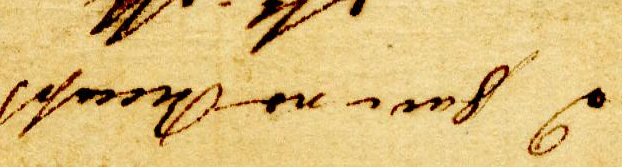I gave no Recept
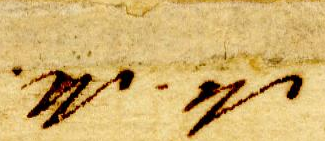M. M
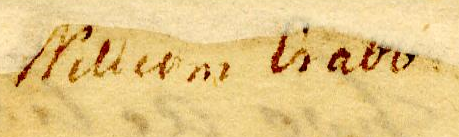William Crabb
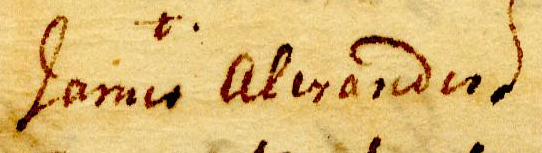James Alexander
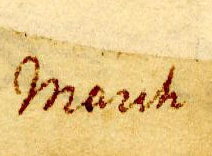March
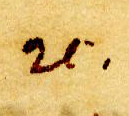20
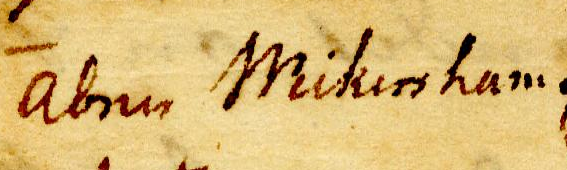Abner Wickersham
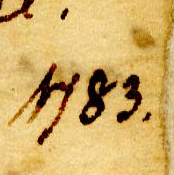1783
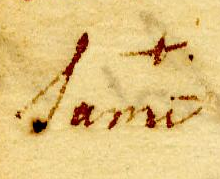Same
